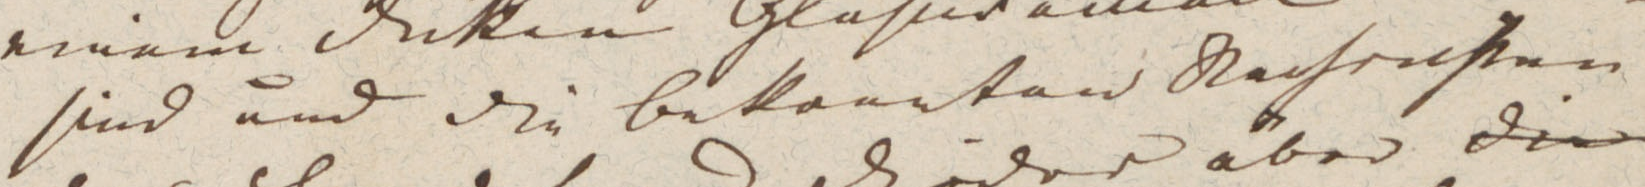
sind und die bekannten Nachrichten
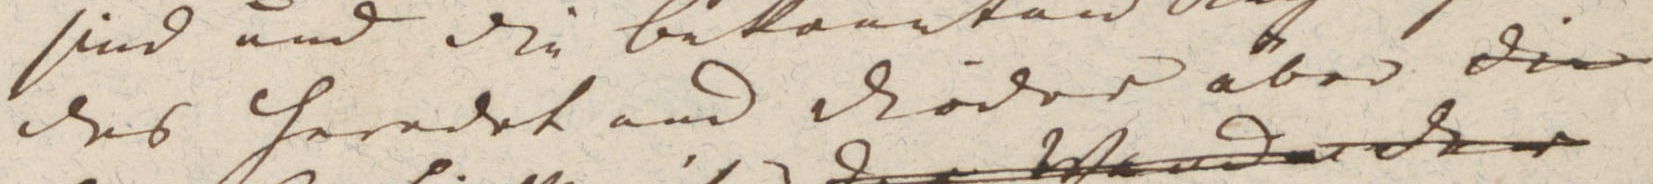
des Herodot und Diodor über die
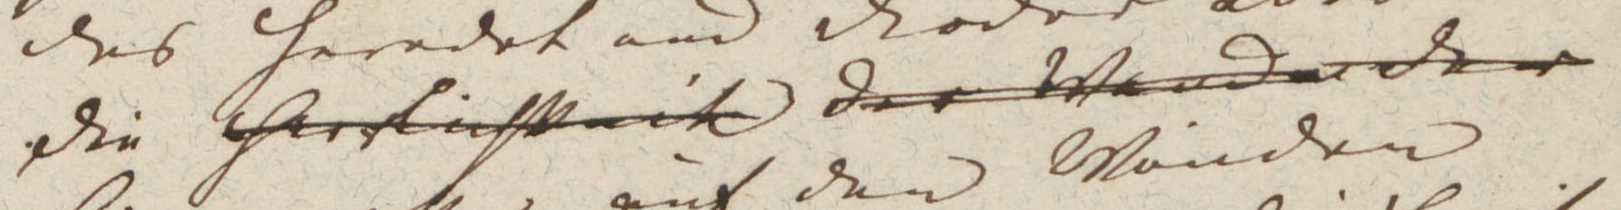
die Herrlichkeit der Wande der
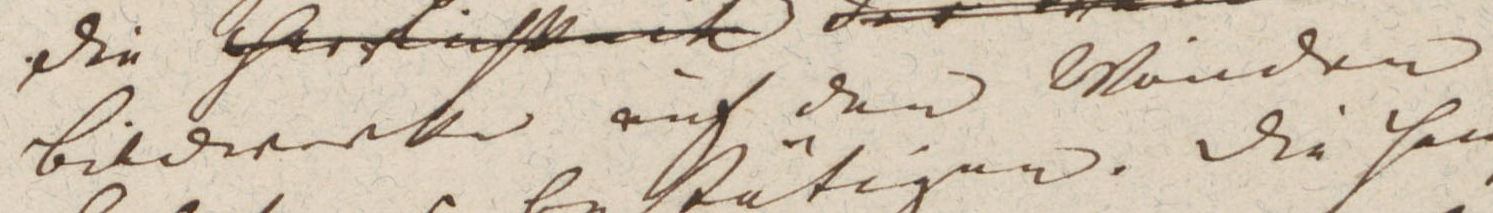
Bildwerke auf den Wänden
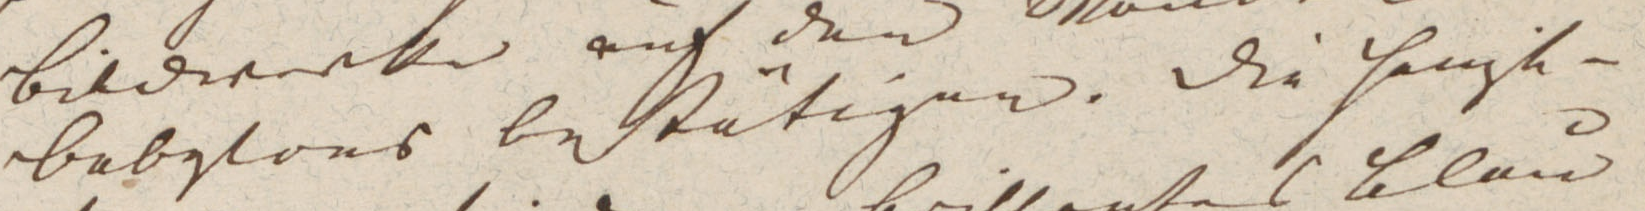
Babylons bestätigen. Die Haupt-
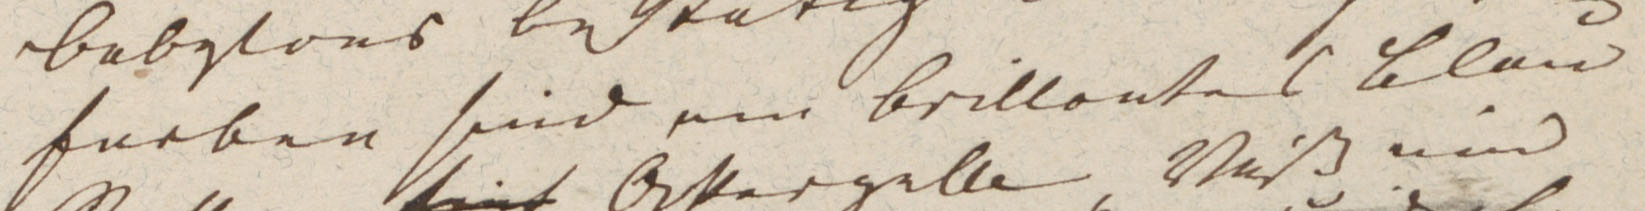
farben sind ein brillantes Blau
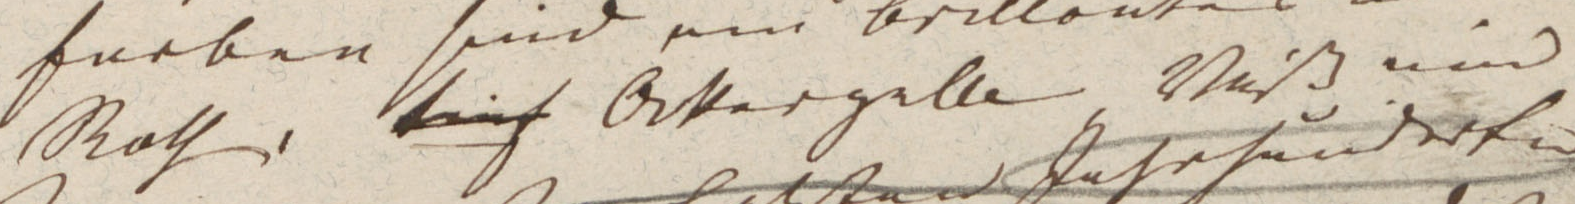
Roth, tief Ockergelb Weiss und
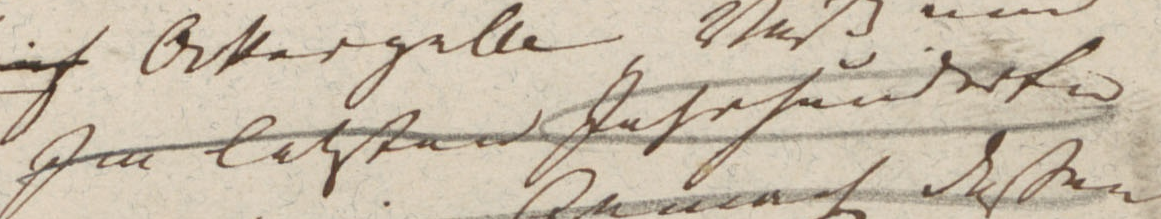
Im letzten Jahrhunderte
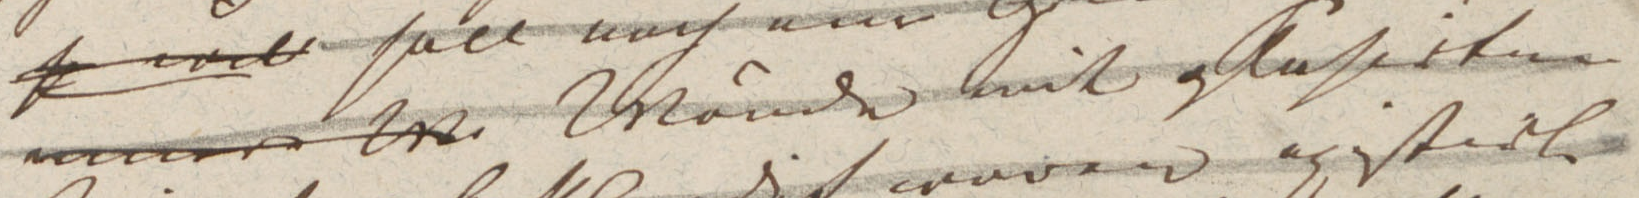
innere W Wände mit glasirten
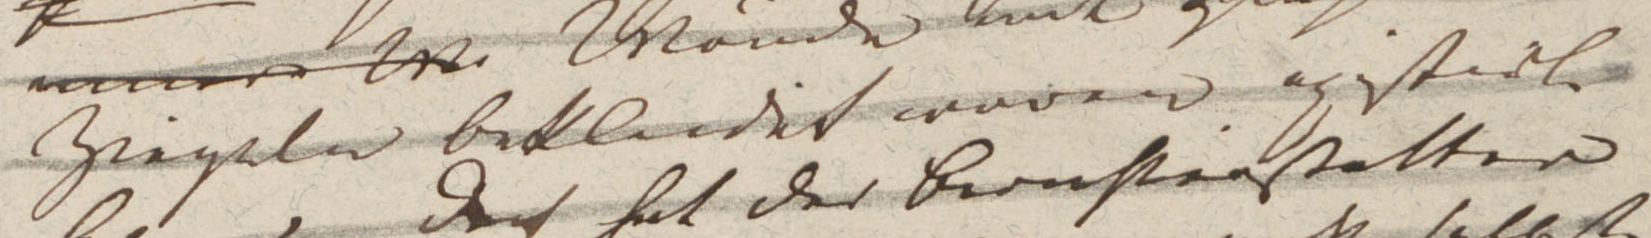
Ziegeln bekleidet waren existirt
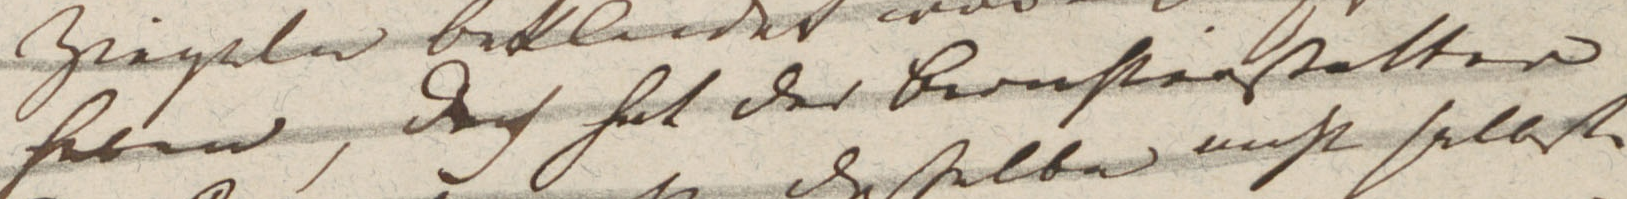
haben, doch hat der Berichterstatter
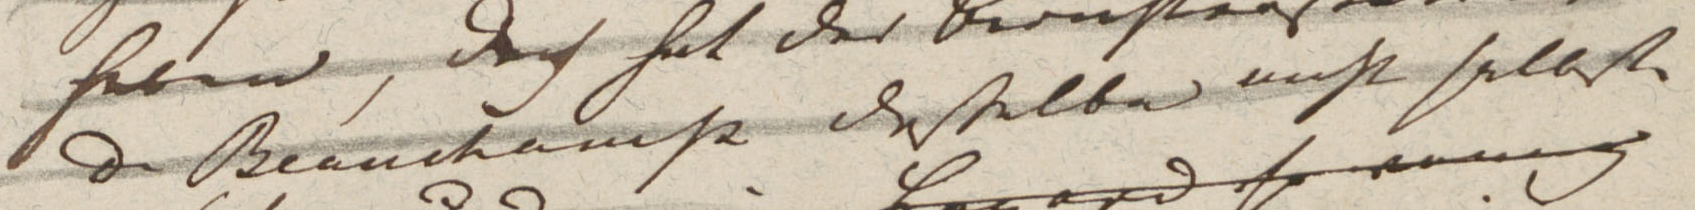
de Beauchamps dasselbe nicht selbst
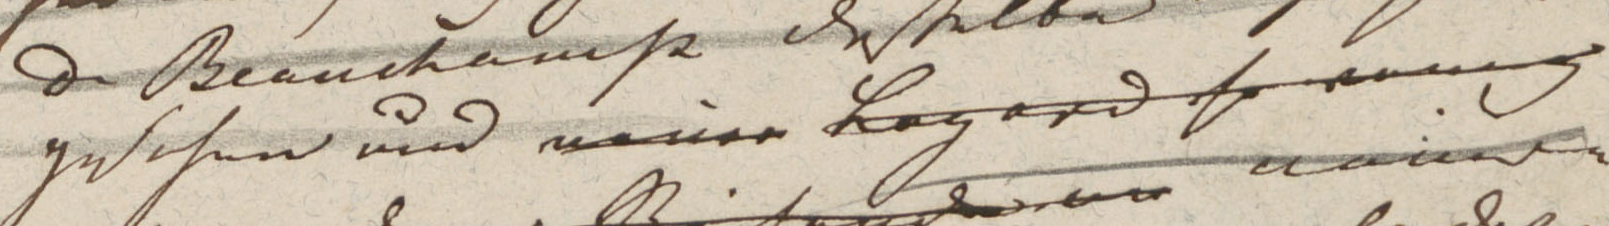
gesehen und neuer Layard so wenig
